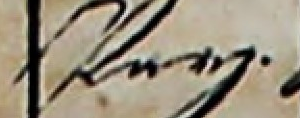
Perg.
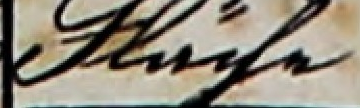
Fläche
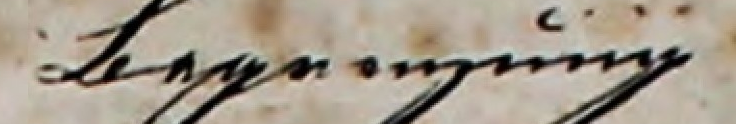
Begrenzung
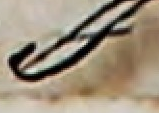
J,
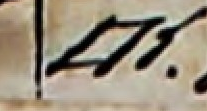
CK.
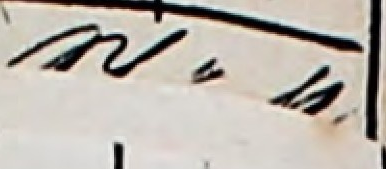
???
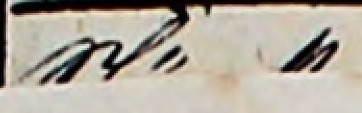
???
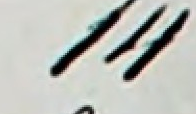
14
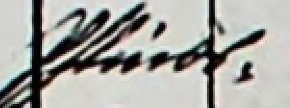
Pflinds„
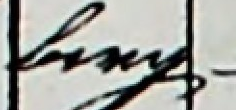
berg
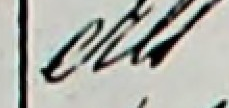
Alt
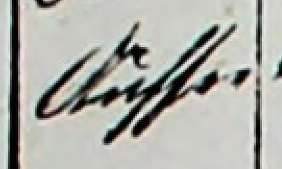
Aussee
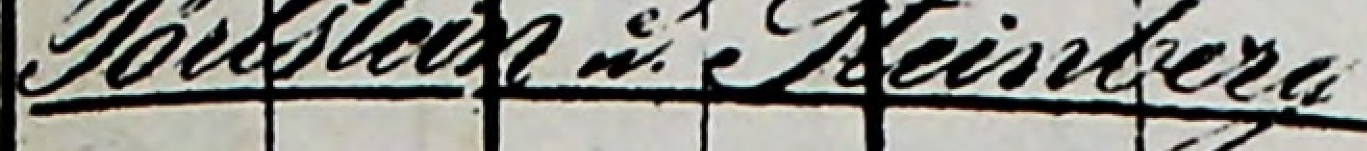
Törlstein u. Steinberg
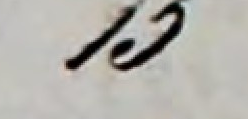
15
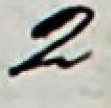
2
